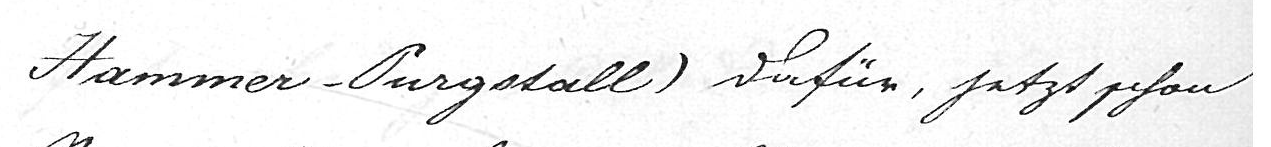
Hammer-Purgstall) dafür, jetzt schon
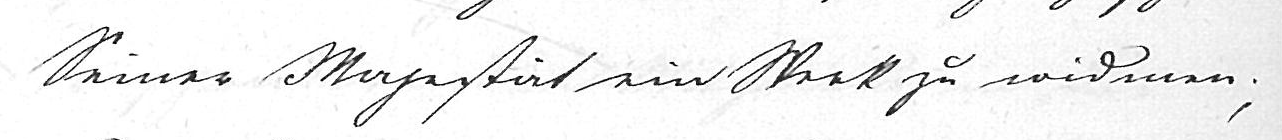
Seiner Majestät ein Werk zu widmen;
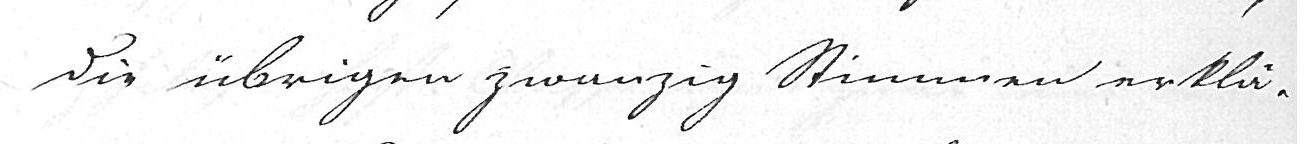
die übrigen zwanzig Stimmen erklä-
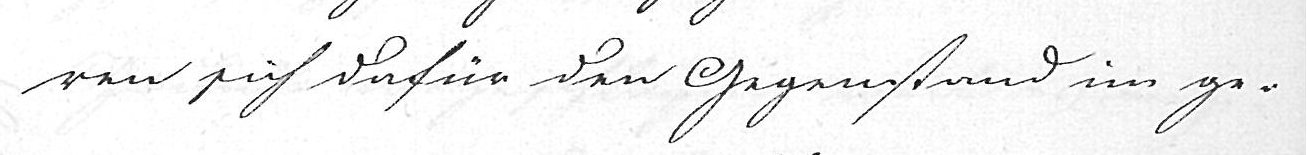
ren sich dafür den Gegenstand im ge-
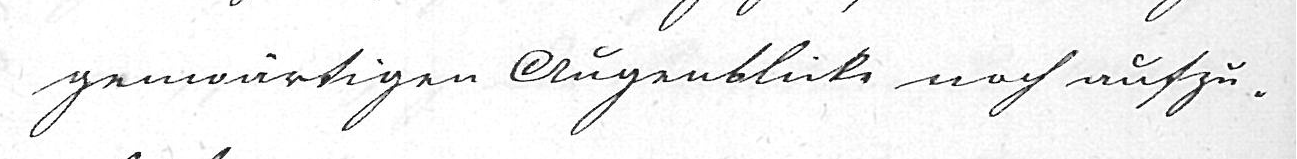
genwärtigen Augenblicke noch aufzu-
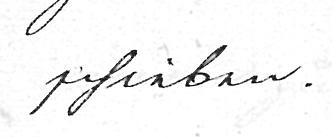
schieben.
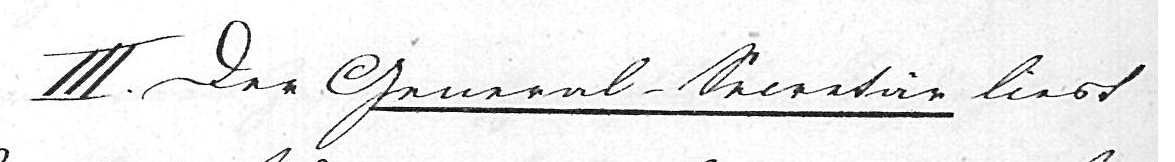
III Der General-Secretär liest
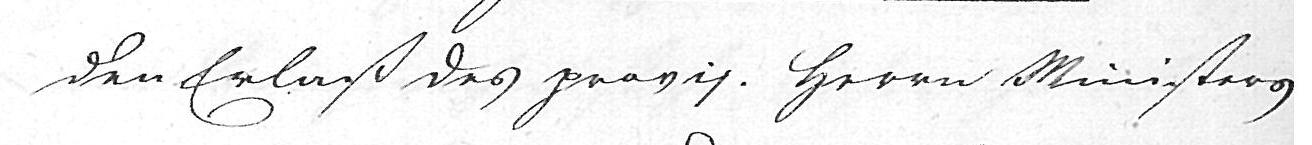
den Erlaß des provis. Herrn Ministers
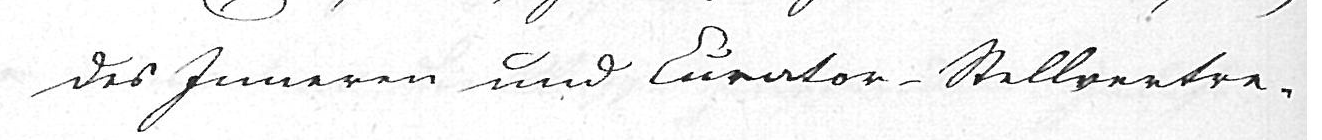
des Inneren und Curator-Stellvertre-
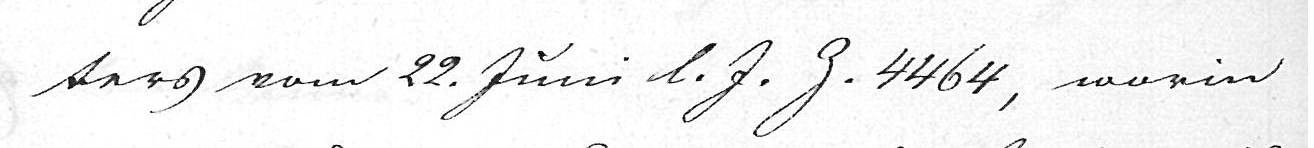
ters vom 22. Juni l. J. Z. 4464, worin
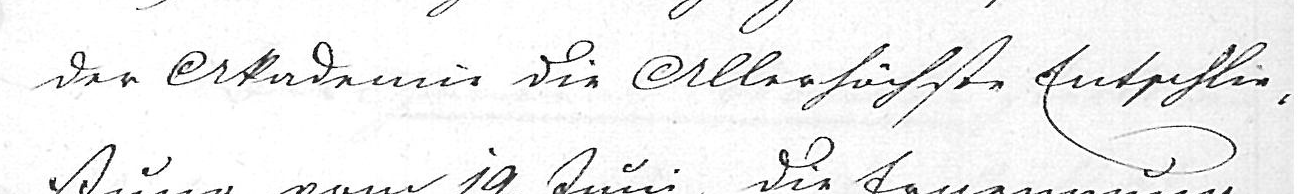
der Akademie die Allerhöchste Entschlie-
